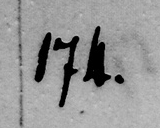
14.
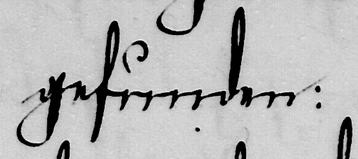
gefunden:
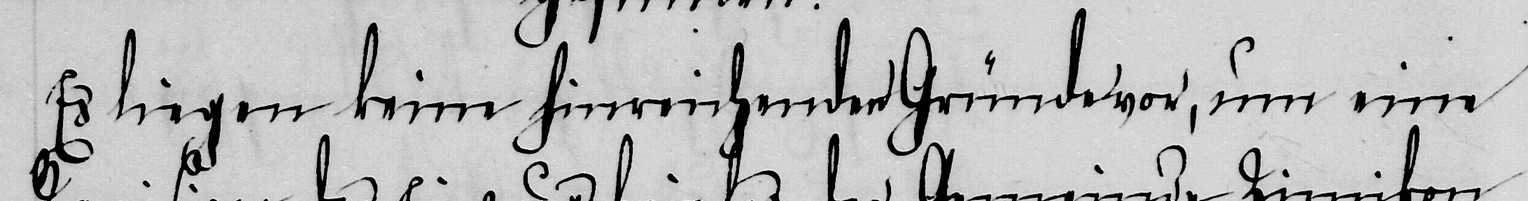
Es liegen keine hinreichenden Gründe vor, um eine
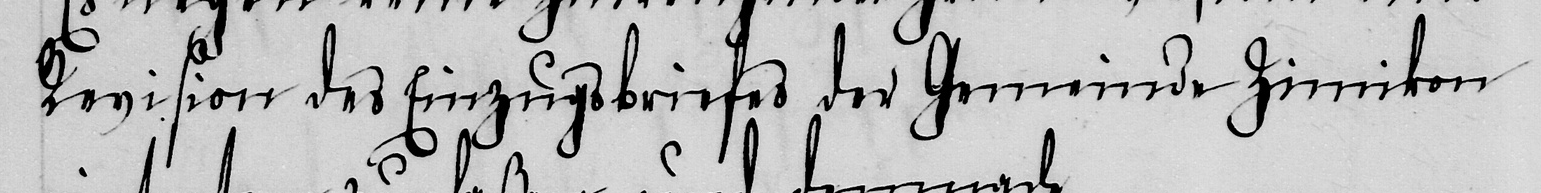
Revision des Einzugsbriefes der Gemeinde Zimikon
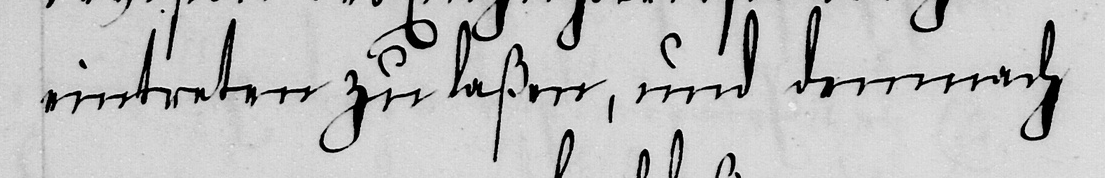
eintreten zu laßen, und demnach
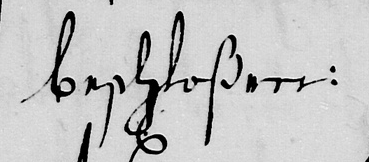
beschloßen:
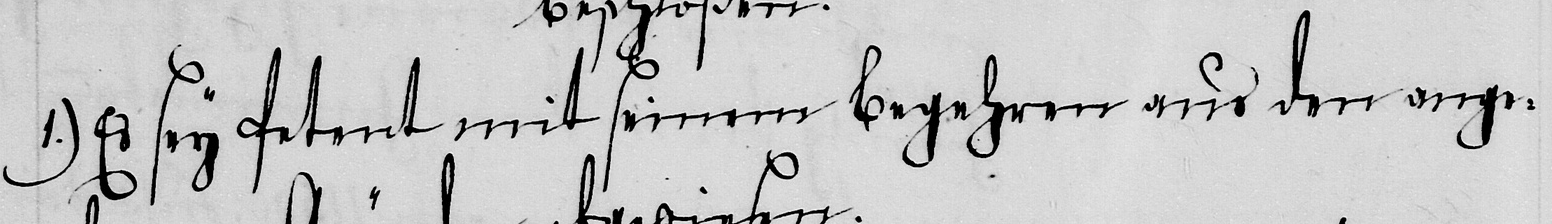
1.) Es sey Petent mit seinem Begehren aus den ange¬
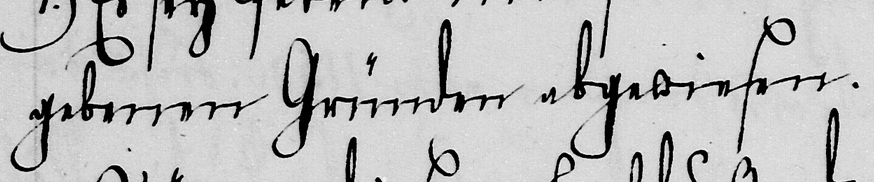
gebenen Gründen abgewiesen.
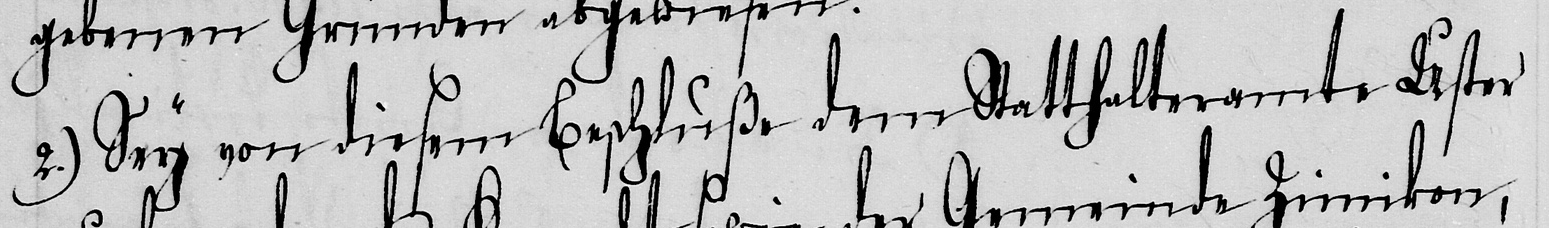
2.) Sey von diesem Beschluße dem Statthalteramte Uster
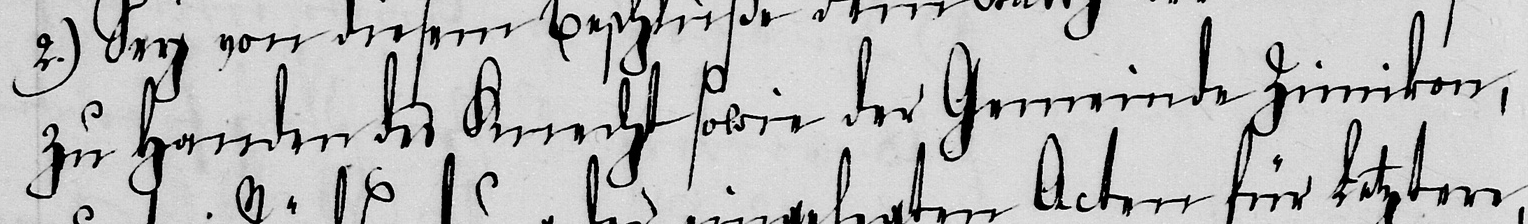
zu Handen des Knecht sowie der Gemeinde Zimikon,
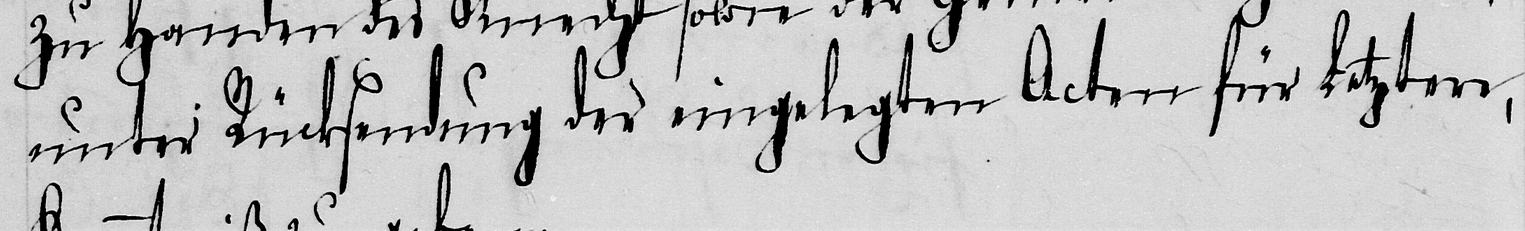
unter Rücksendung der eingelegten Acten für Letztere,
